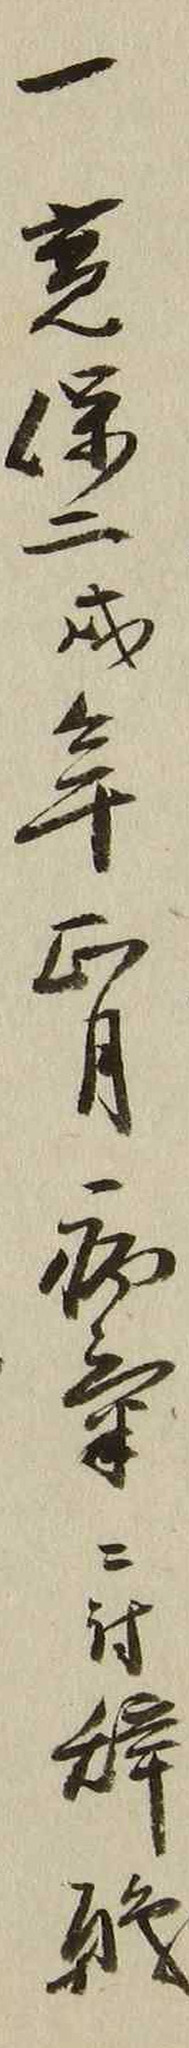一寛保二戌年正月病気に付辞職
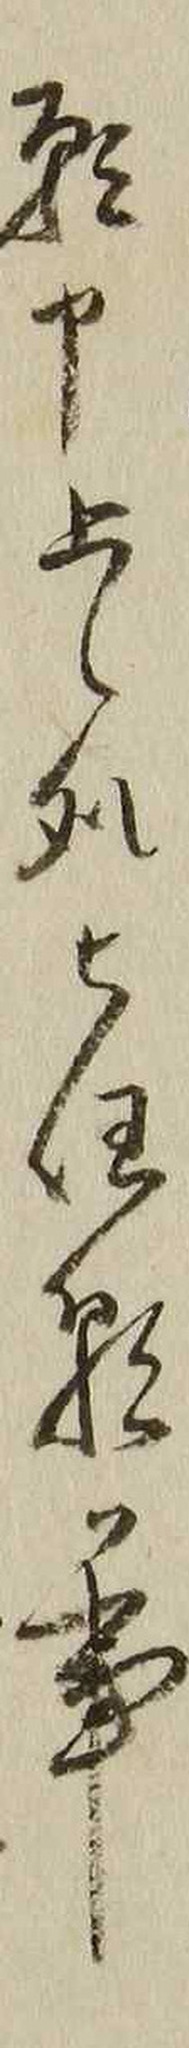願申上候処被任願候事
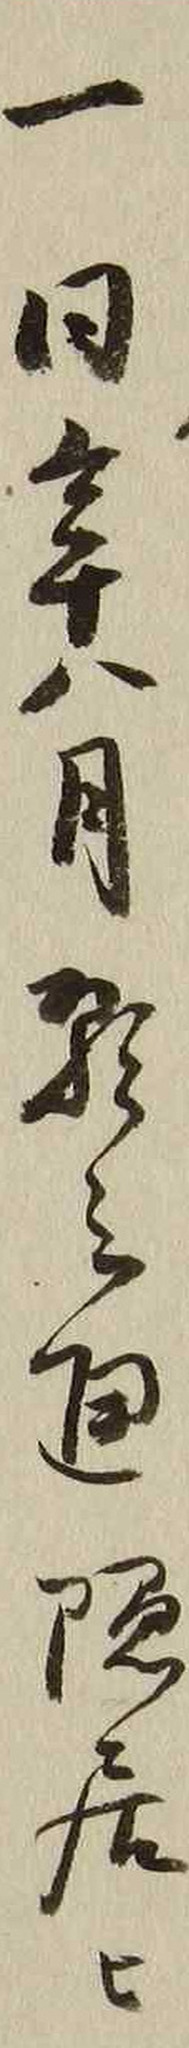一同年八月願之通隠居被
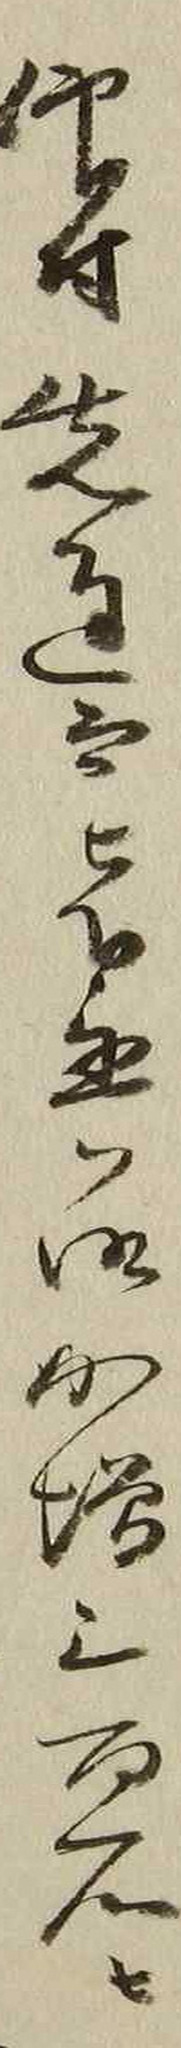仰付先達而被下置候御加増三百石被
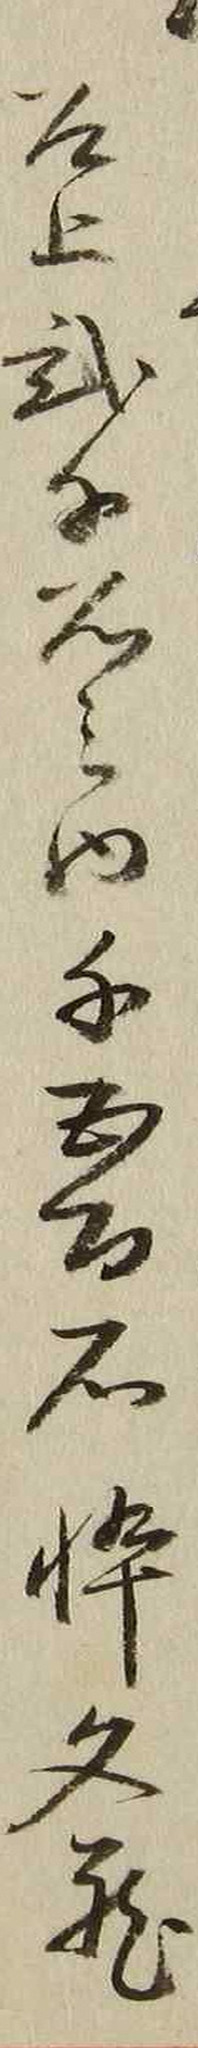召上弐千石之内千五百石忰久蔵
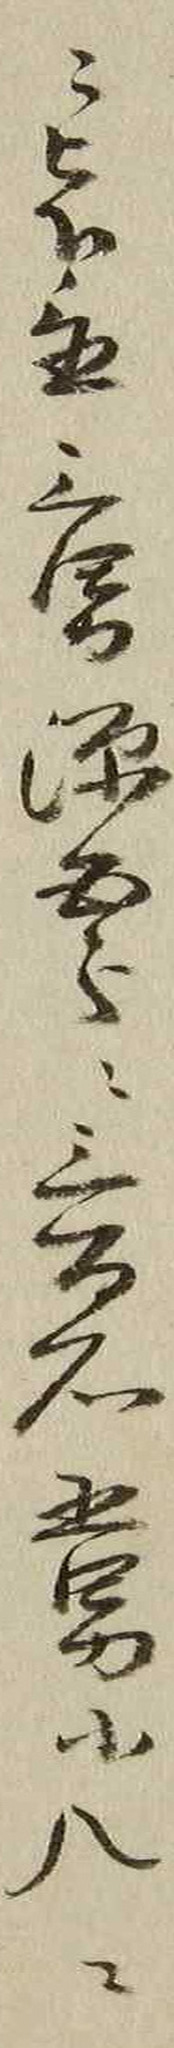に被下置三男源五郎に三百石五男小八に
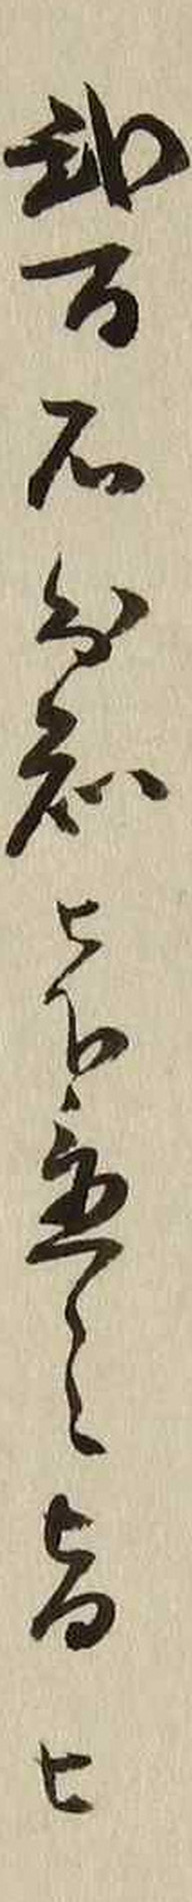弐百石分知被下置候旨被
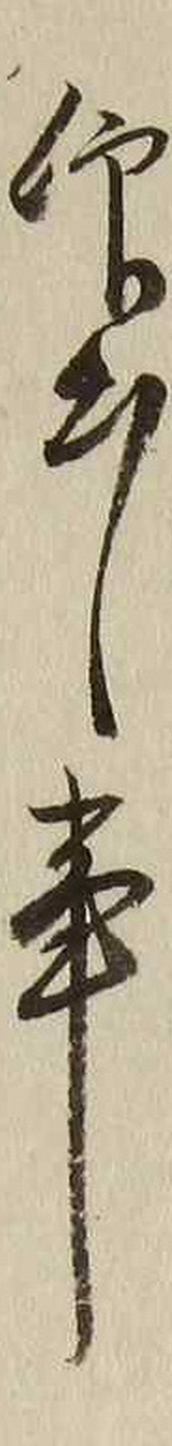仰出候事
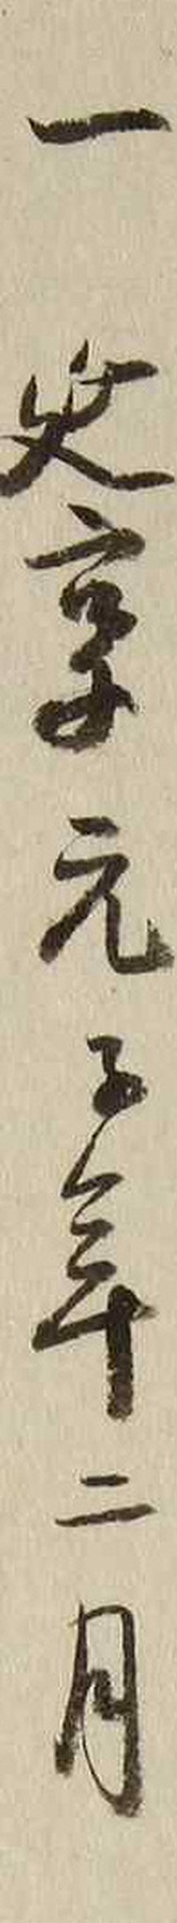一延享元子年二月
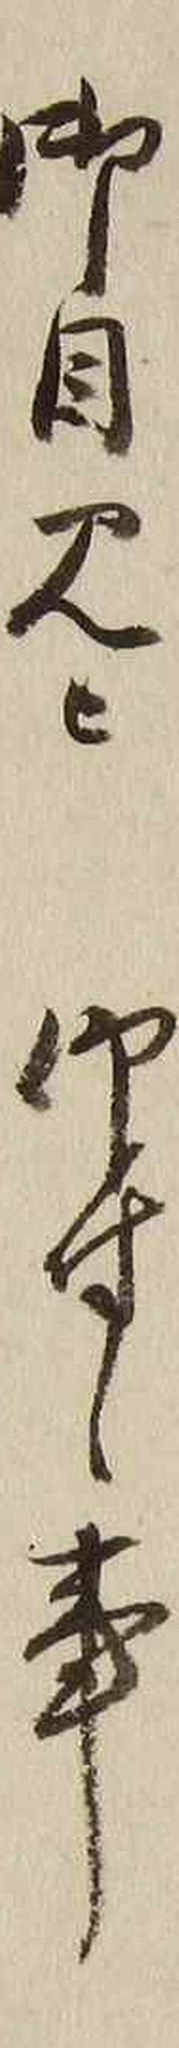御目見被仰付候事
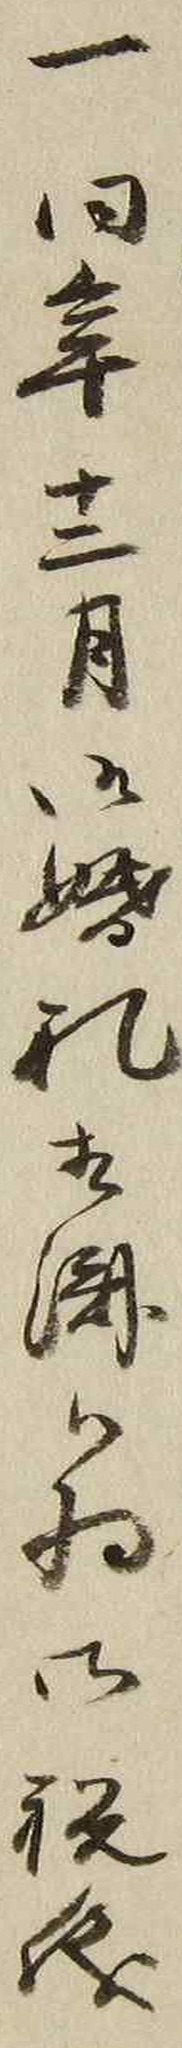一同年十二月御婚礼相済候為御祝儀
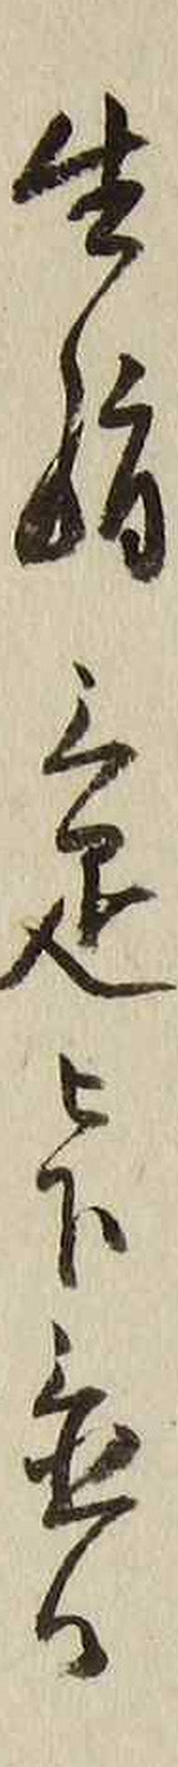生絹三疋被下置候
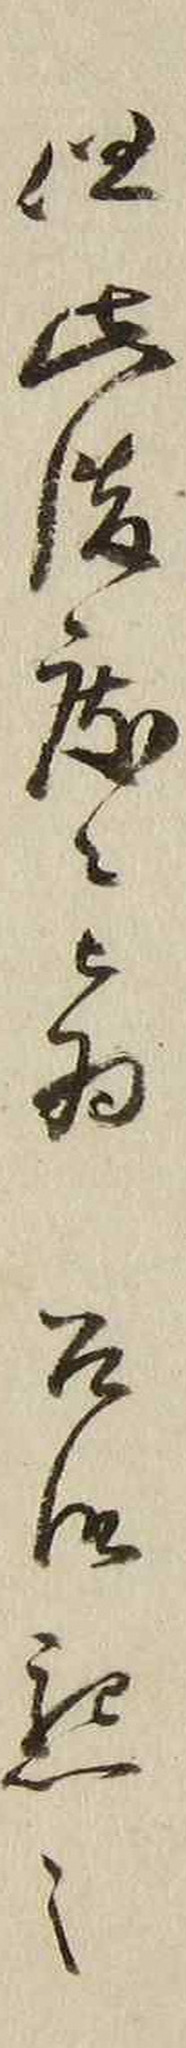但此後度々被為召御懇之
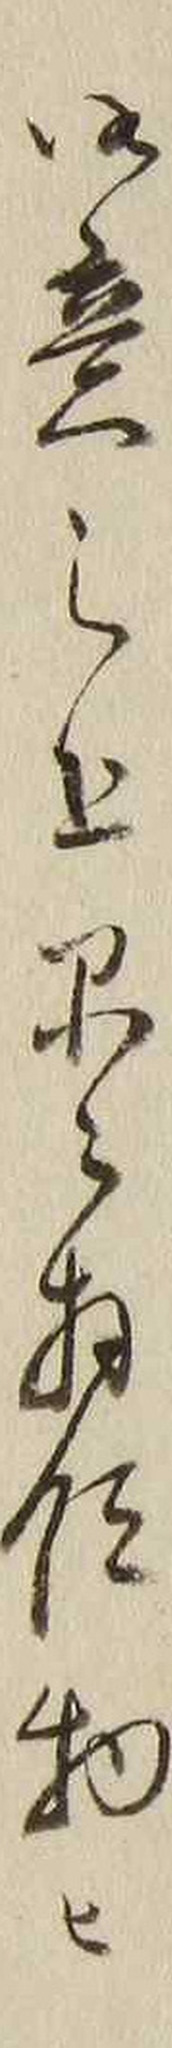御意之上品々拝領物被
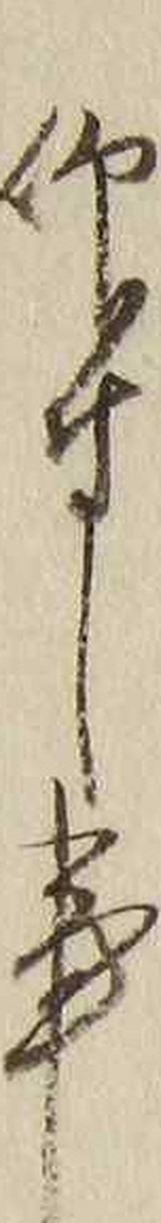仰付候事
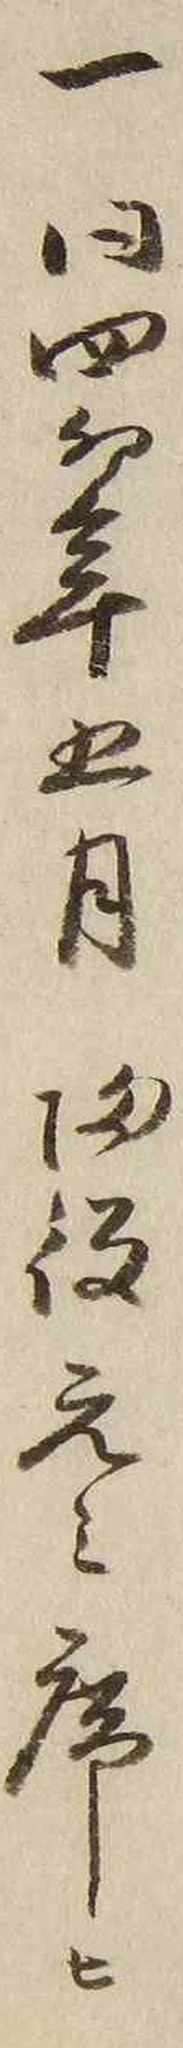一同四卯年五月御役元之席被
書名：諸士系譜　巻之269　さ之部1
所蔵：会津若松市立会津図書館
